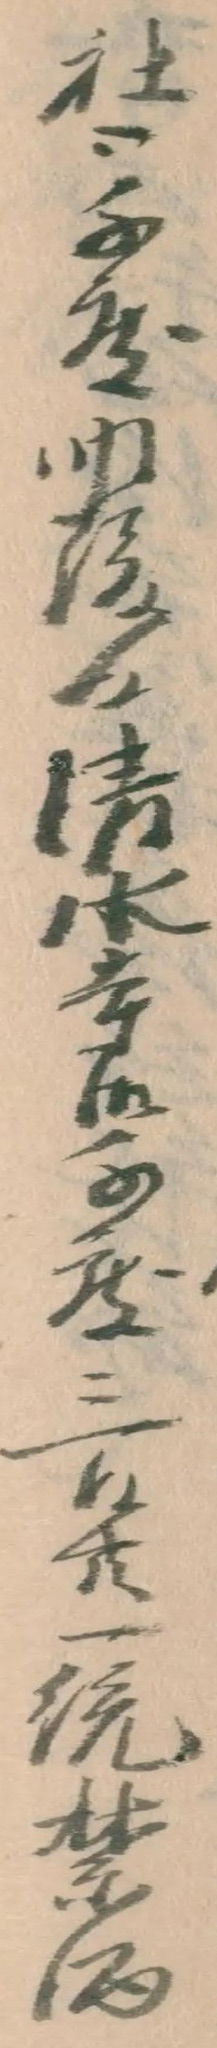社御年度明後日清水寺御千度三日共一統禁酒
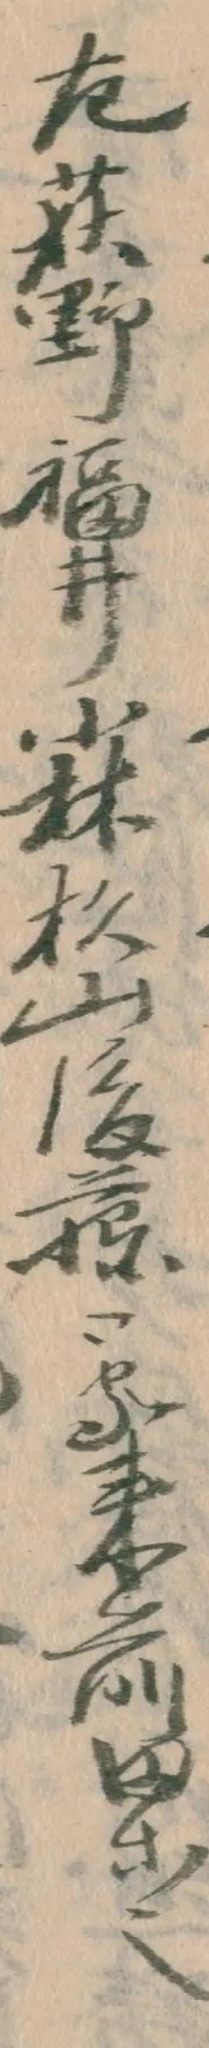左萩野福井小林杦山後藤御家来前田等也
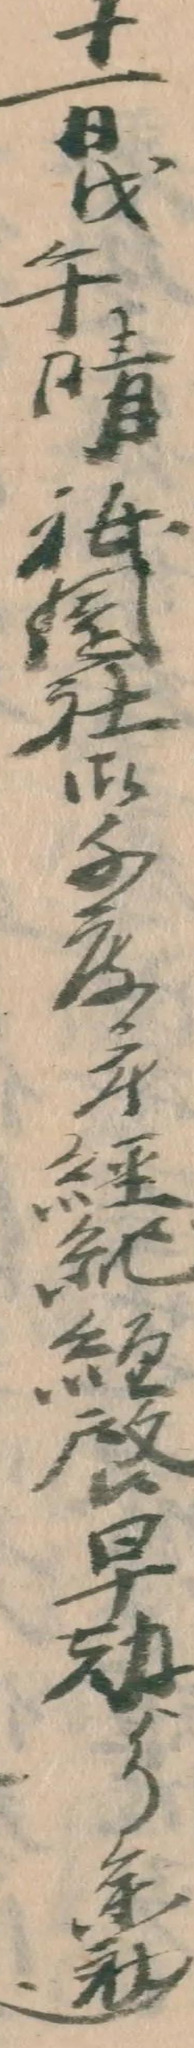十一日戊午晴祇園社御千度ニ付経紀経啓早朝より参勤也
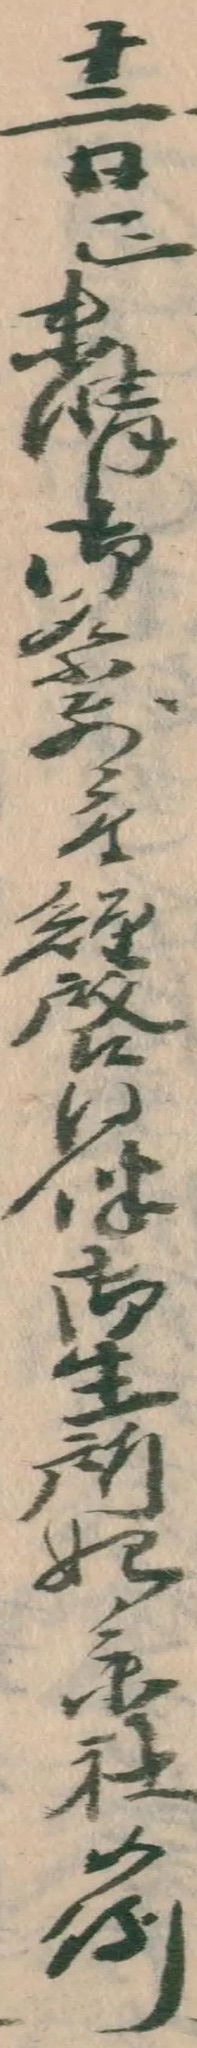十二日巳未晴御祭前ニ付経啓同伴御生所始参社如例
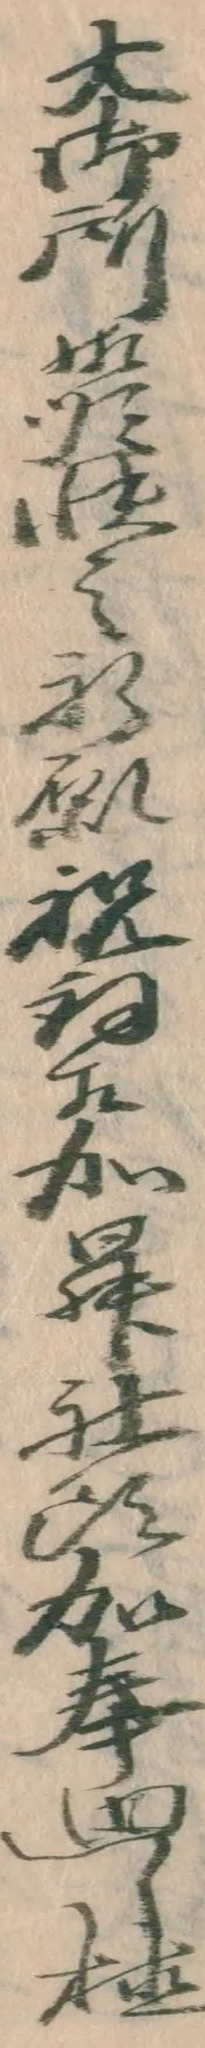大御所御順快之祈願祝詞相加昇社頭加奉廻之植
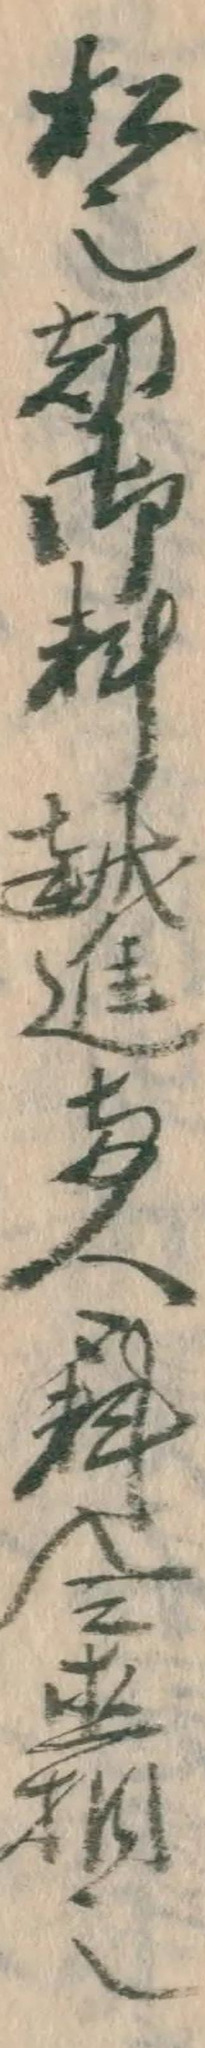松也朝御料越進両人御料令直相也
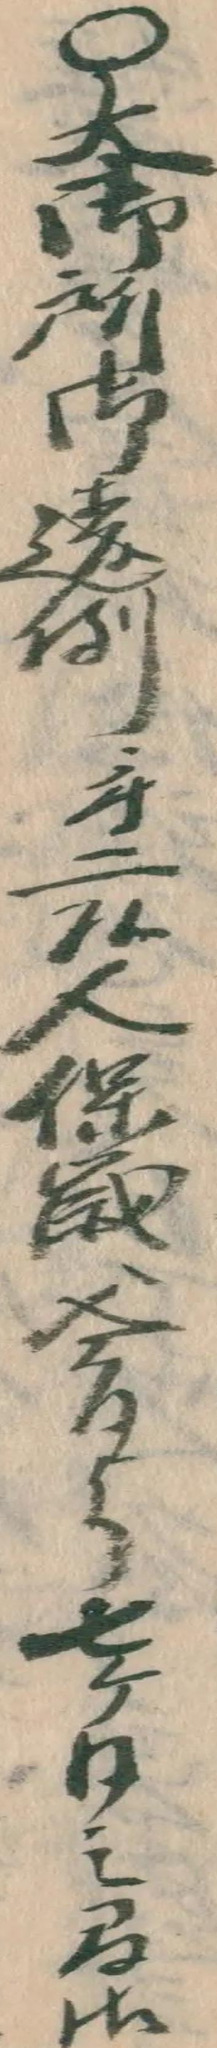○大御所御違例ニ付二頭人保歳へ今日より七ケ日之間御
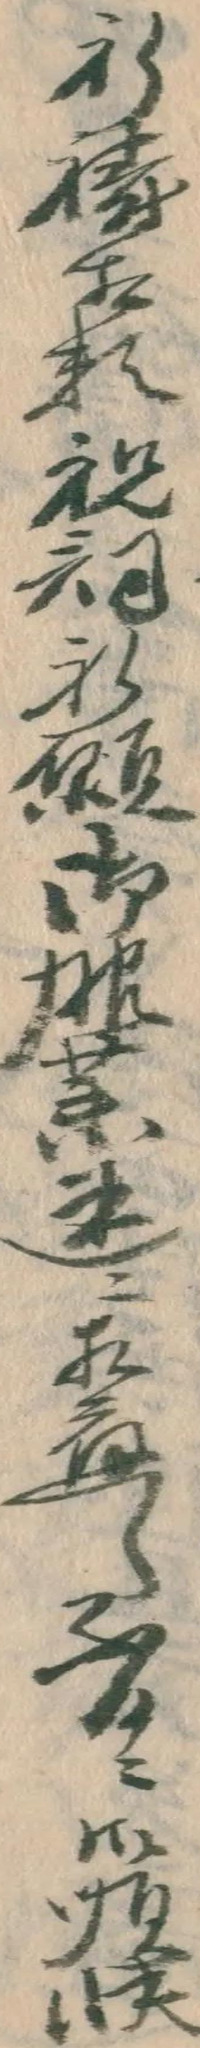祈祷相頼祝詞新願御服薬速ニ相應し不日ニ御順快
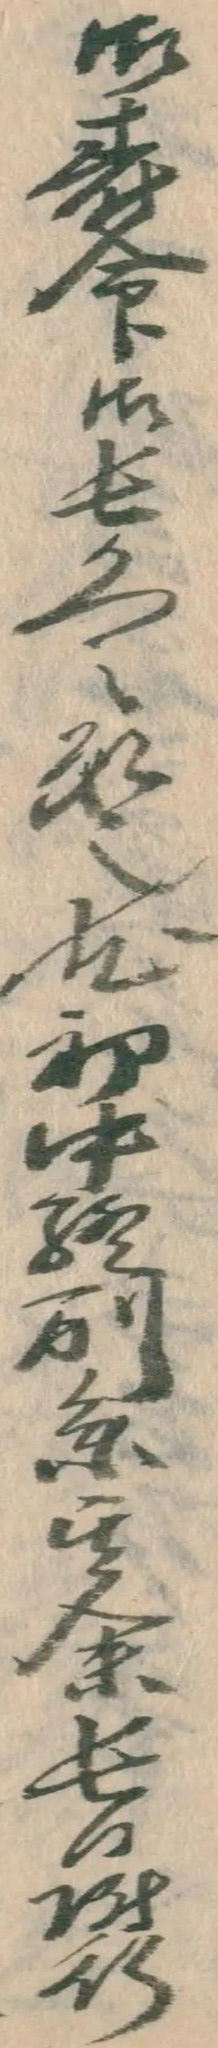御寿命御長久之願也尤初中終別参其余長日附行
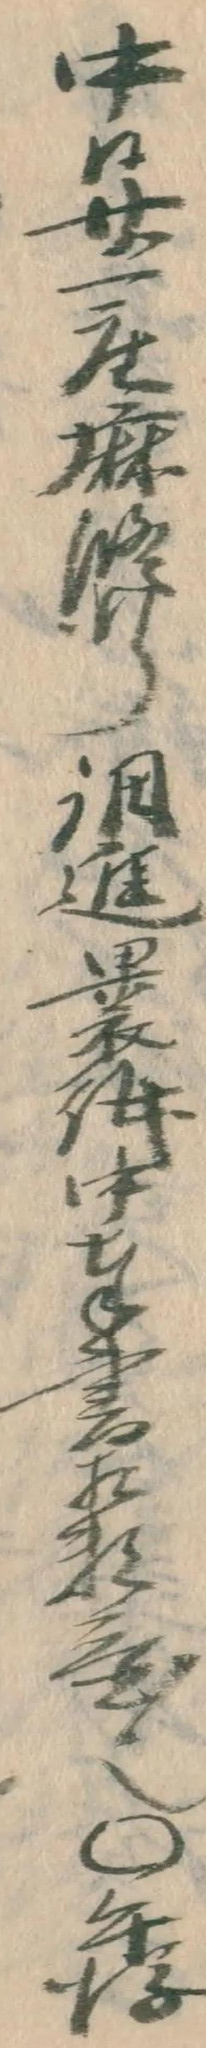中日廿一座麻修行調進褁紙奉書相願置也〇午後
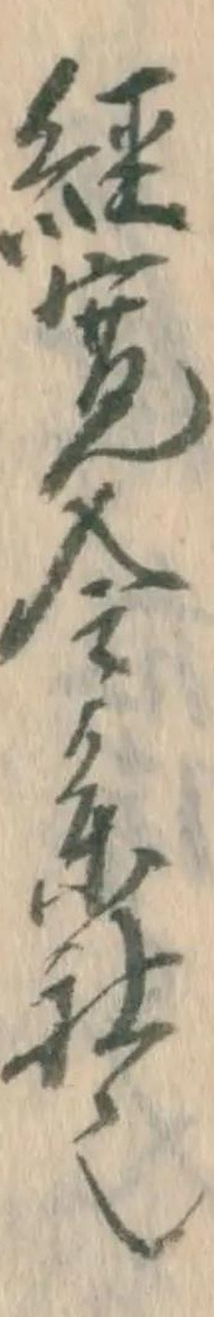経寛令参社也
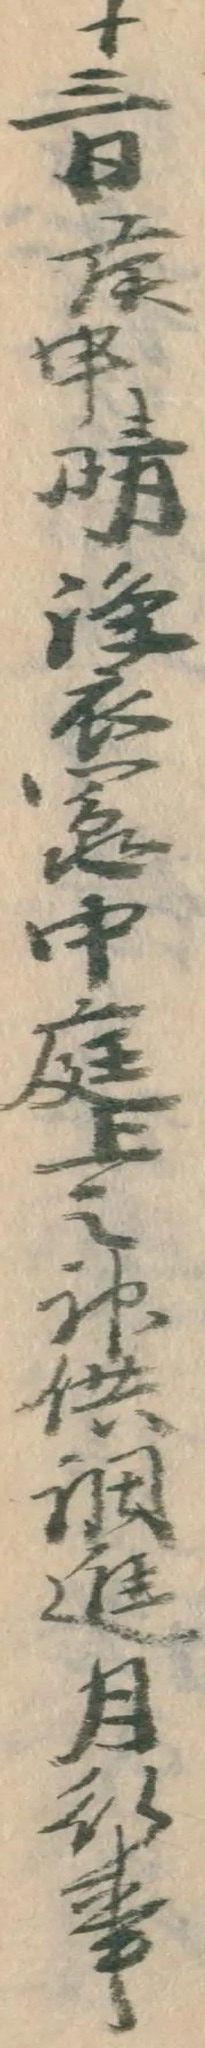十三日庚申晴浄衣鬮中庭上之神供調進月行事

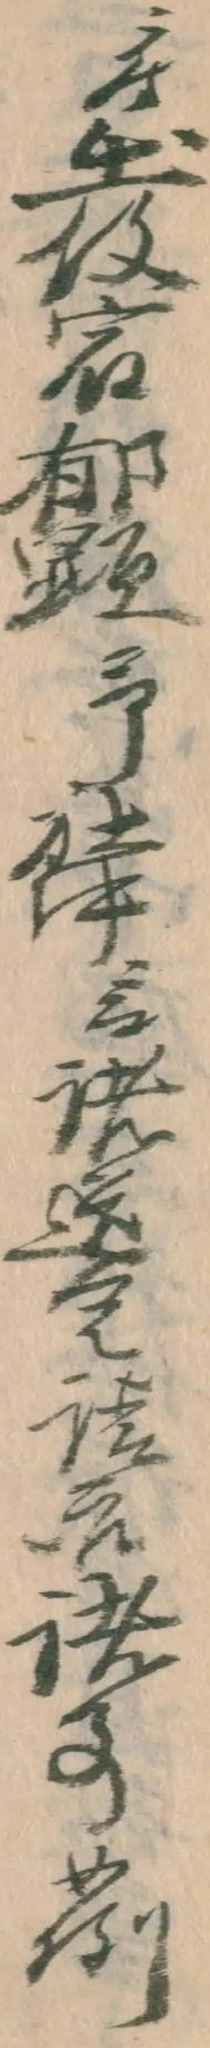ニ付出役宿郁顕予社中ニ而諸道具請取諸事如例
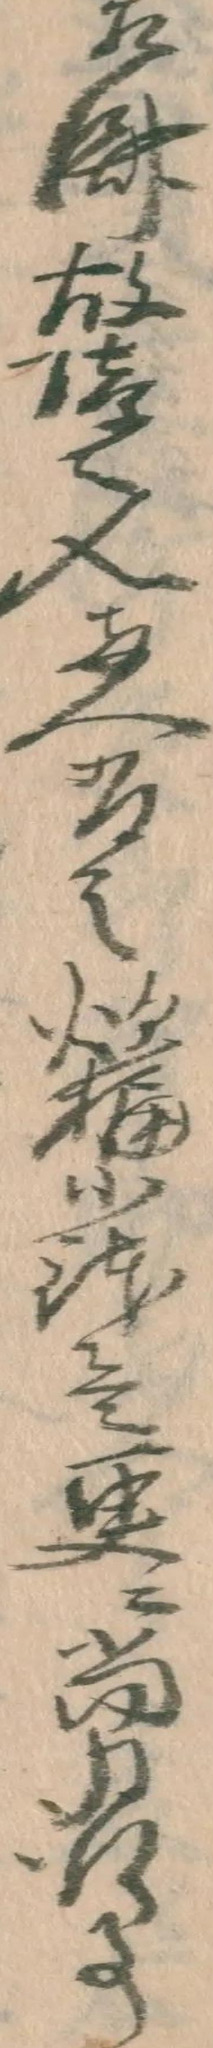相済故障之人両人有之炊桶小鉢壱更ニ當月行事
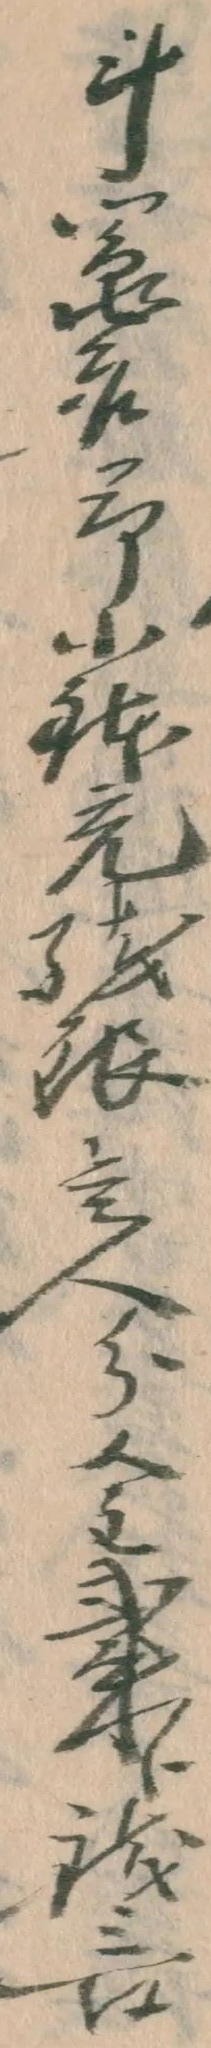斗鬮差予小鉢充残銀壱人分金弐朱え銭三百
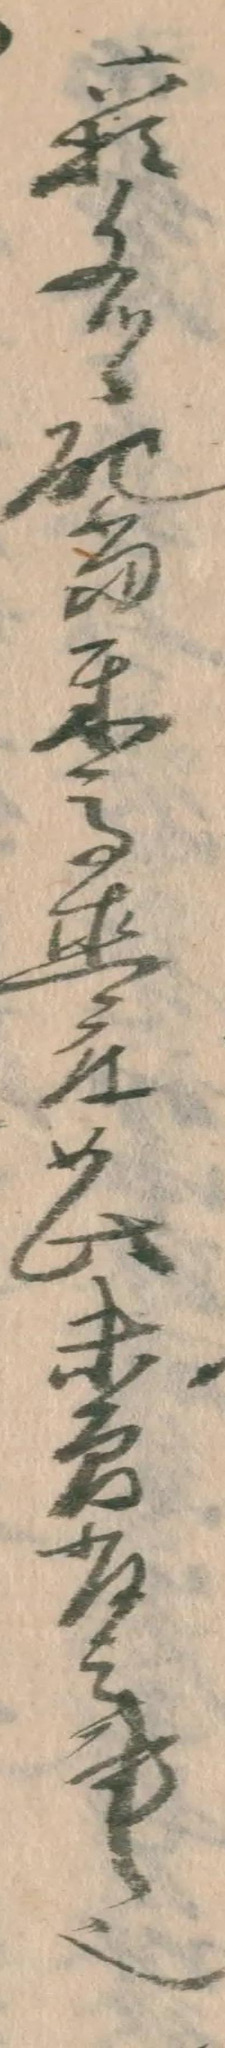六拾文ツヽ配当米高直ニ付如此未曾有之事也
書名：賀茂社記録. 第67冊
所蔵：国立国会図書館 National Diet Library, JAPAN
